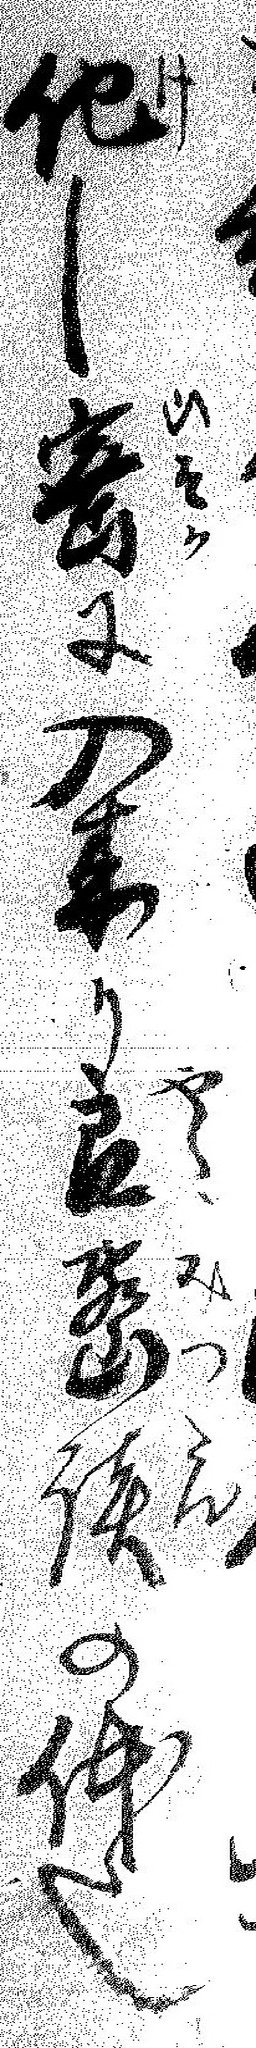化し密に入来り良密談の体也

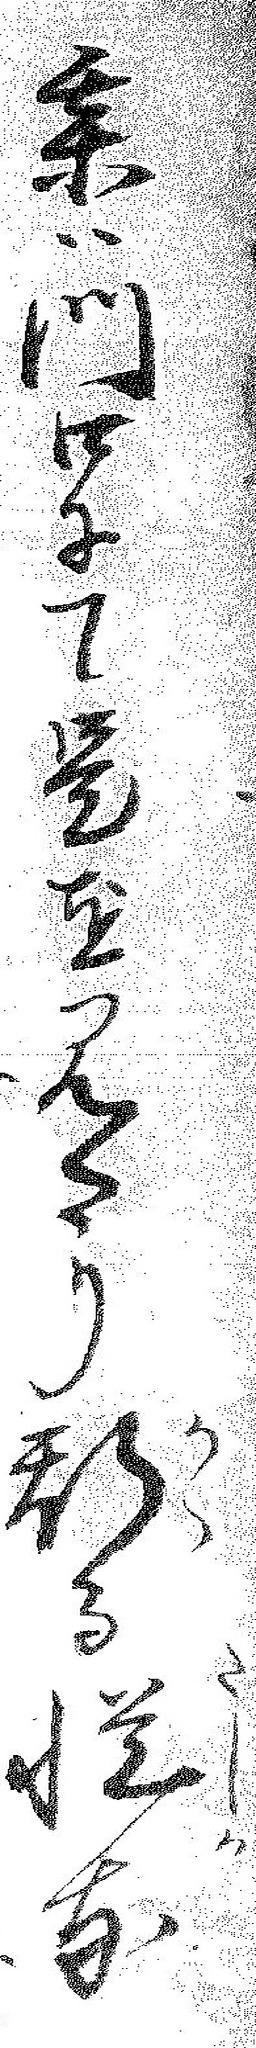某は門口にて是を見たり斯る慥な
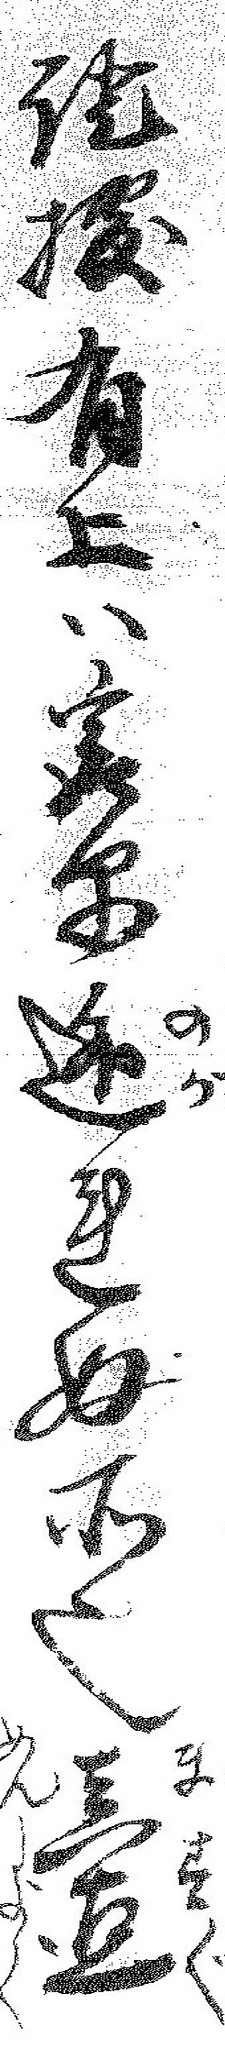証拠有上は最早逃れぬ所也真直
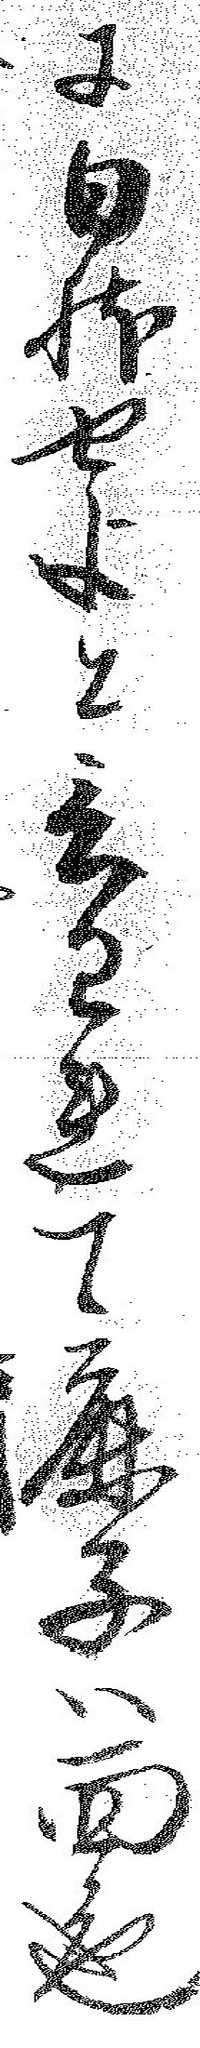に白状せよと云われて鹿子は面色
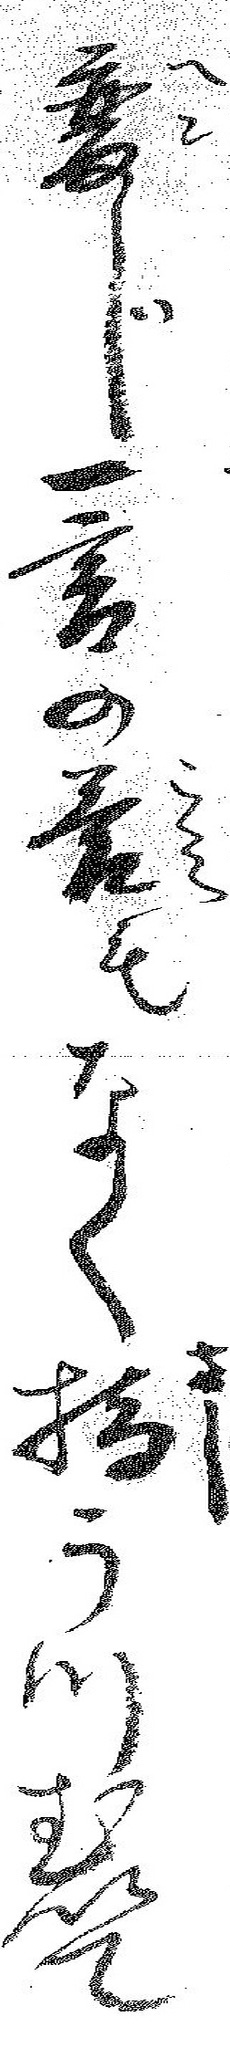変じ一言の答もなく指うつむいて
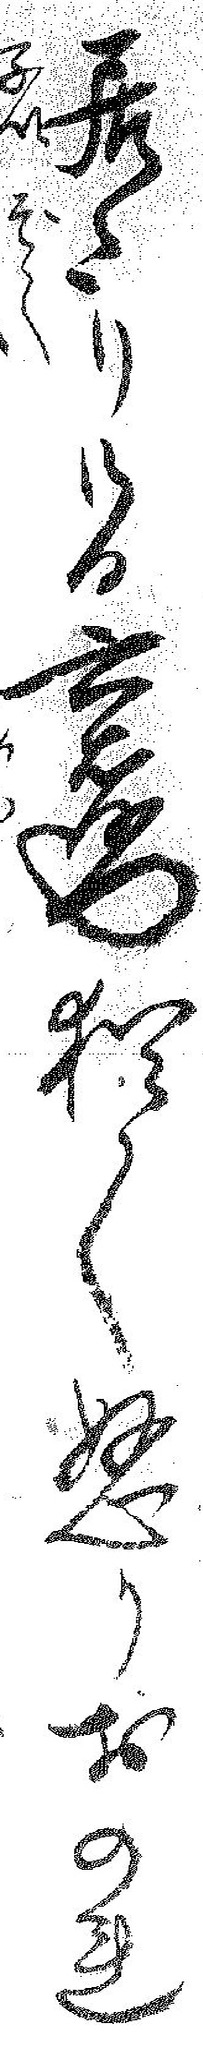居たりける六右衛門猶〳〵怒りおのれ
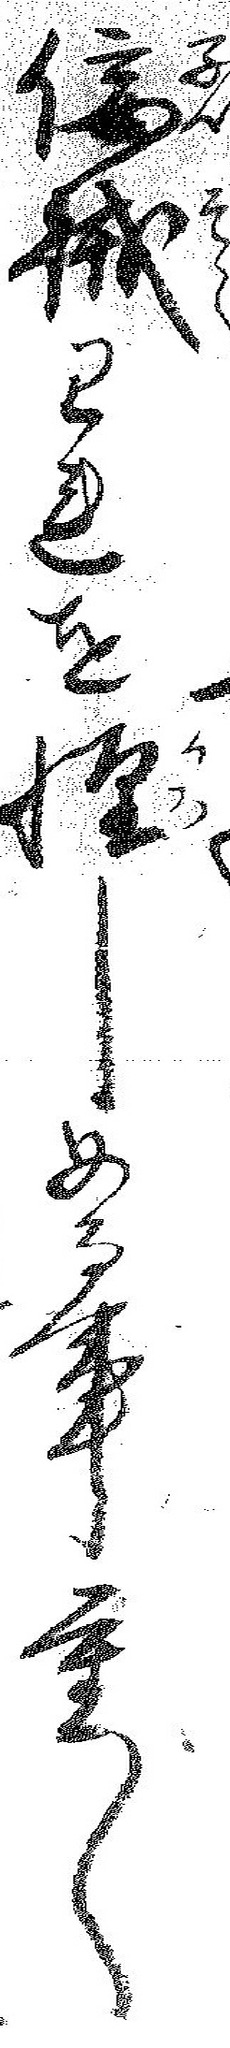佞賊われを軽しめる事重〳〵
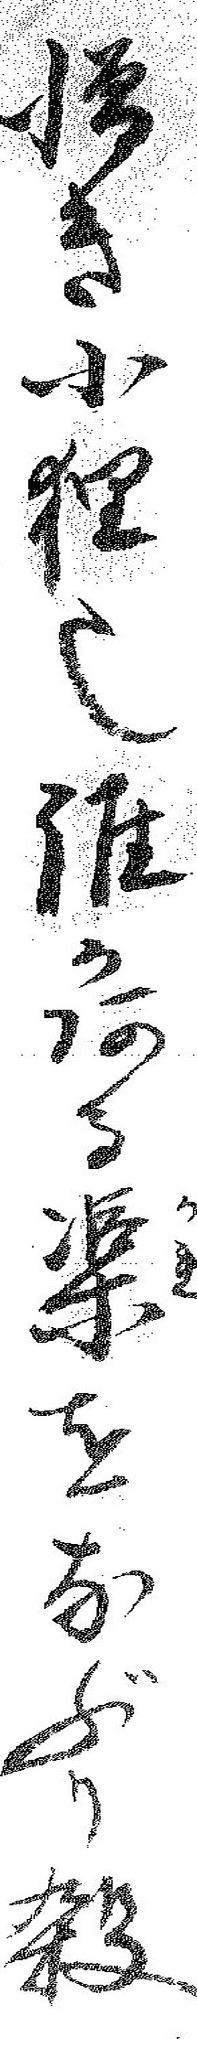憎き小狸也誰かある渠をなぶり殺
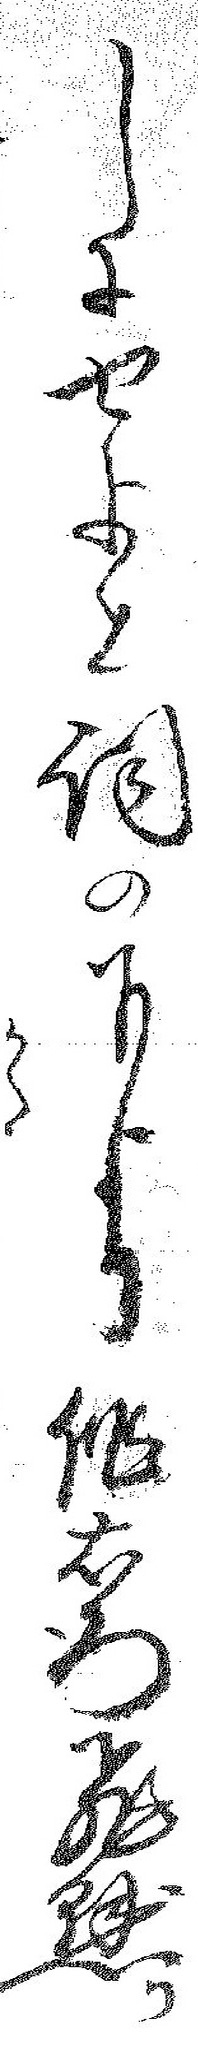しにせよと詞の下より作右衛門飛懸り
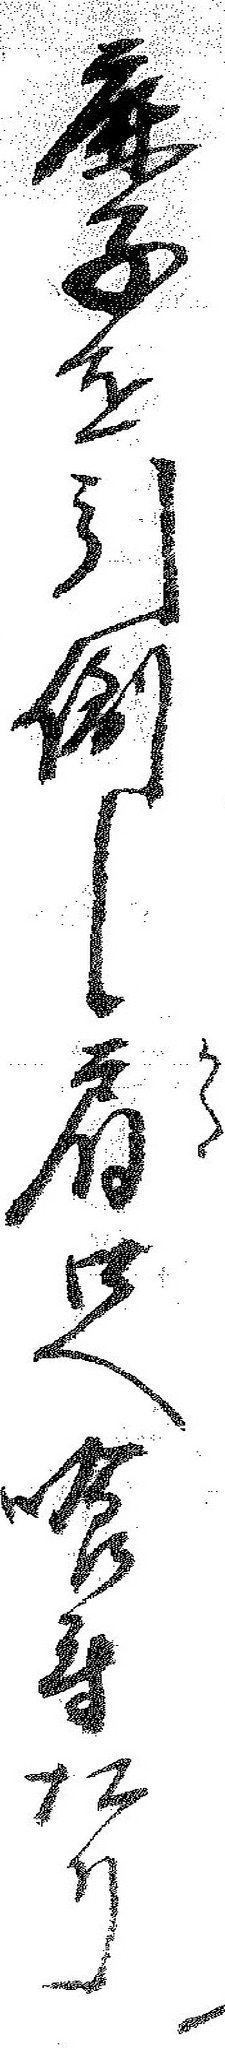鹿子を引倒し肩口へ喰付たり
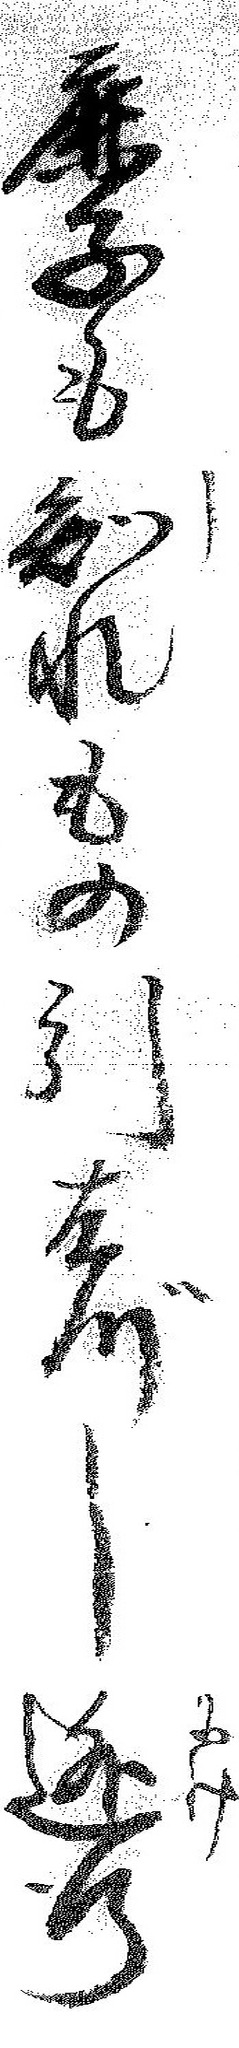鹿子も知れもの引はづし逃行
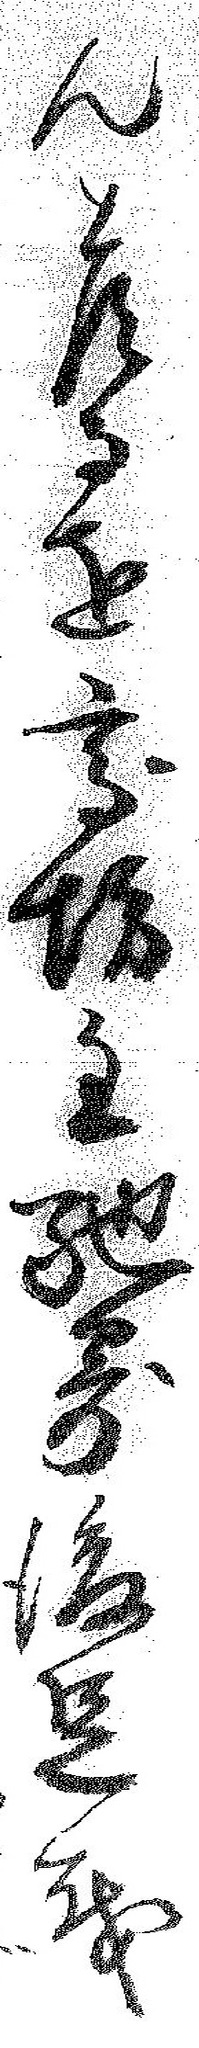んとするを高坊主馳寄後足を
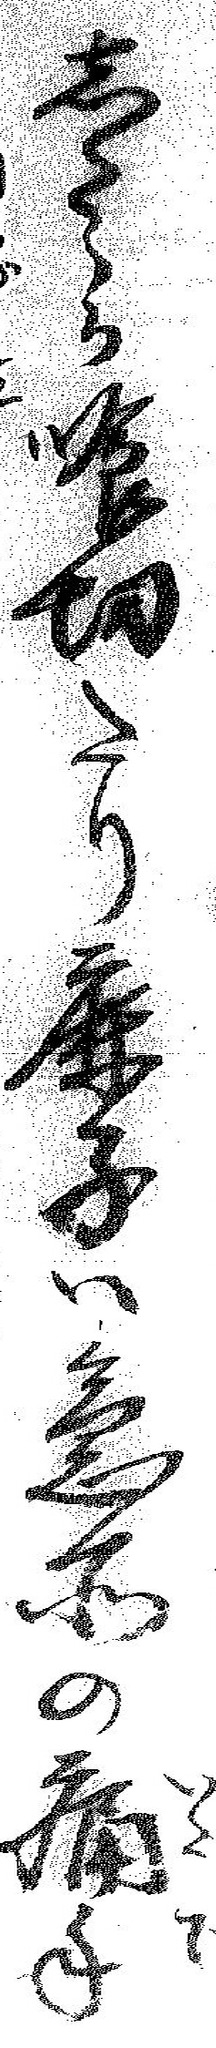したゝか喰切たり鹿子は急所の痛手
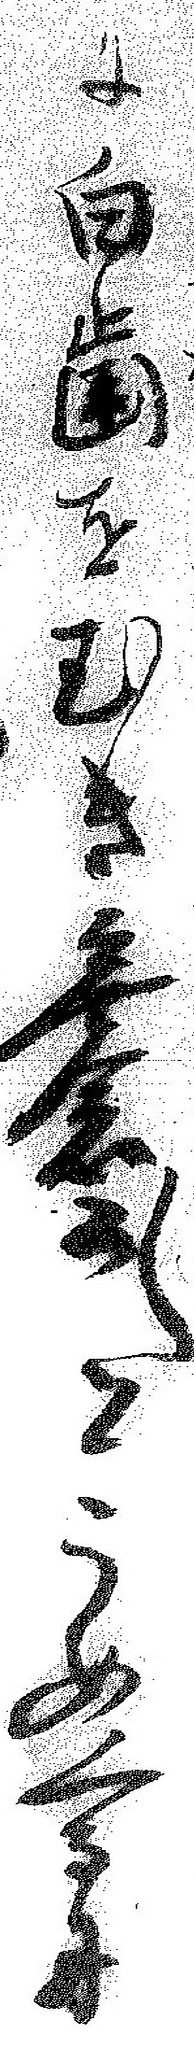に白歯をむき無念とうめくるに
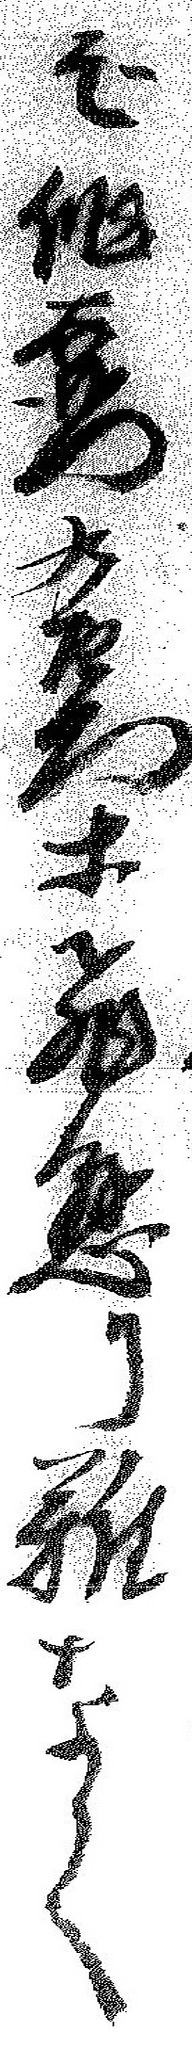ぞ作右衛門九左衛門等飛懸り難なく
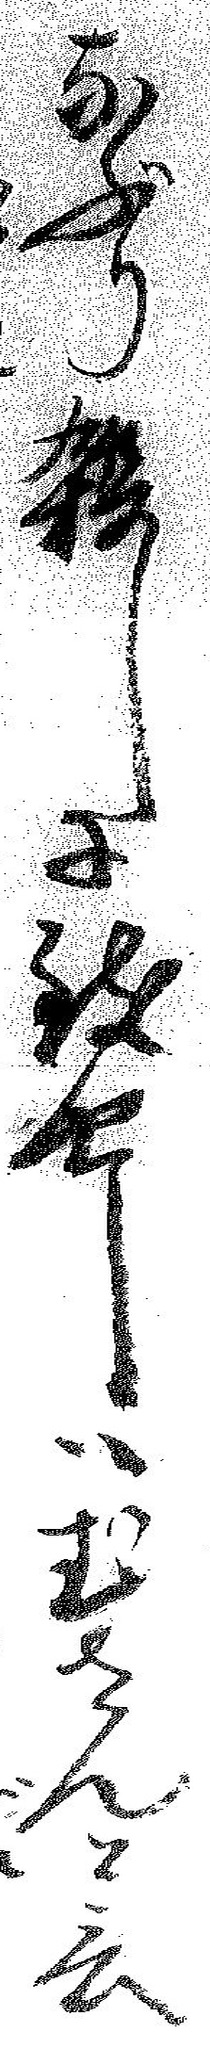なぶり殺しに致せしはむさんと云
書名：近頃古狸珍説　礼義智信
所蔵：徳島県立図書館
